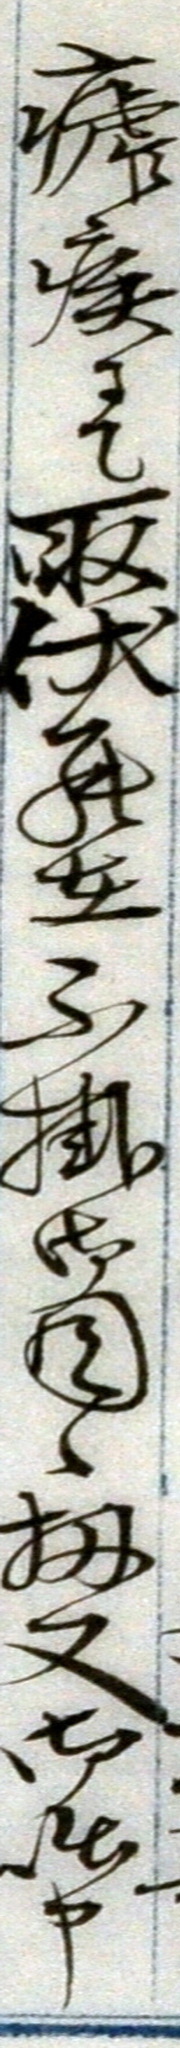瘧疾尓て取伏罷在不掛御目候扨又御咄申
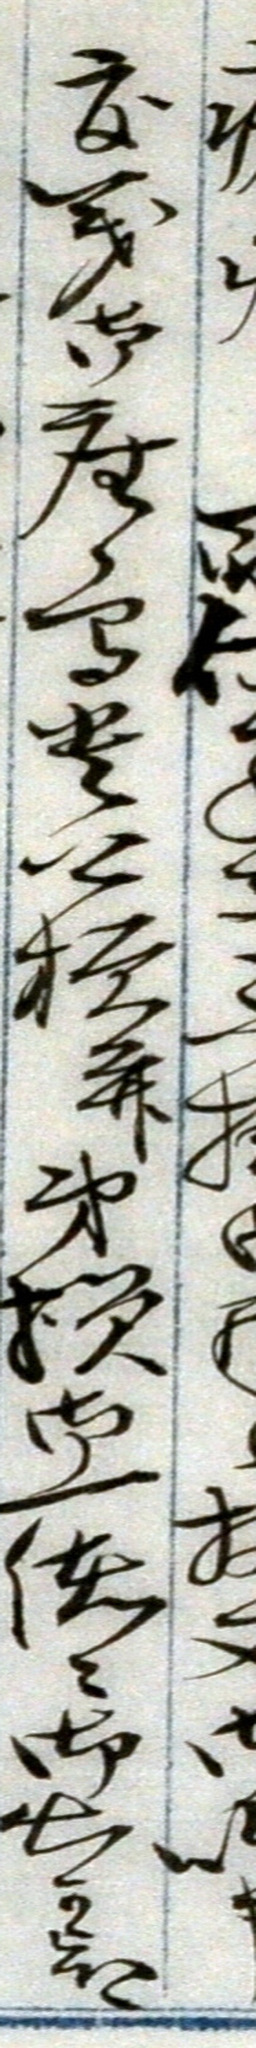度義御座候間貴公様幷弟様御一緒ニ御出可被下候
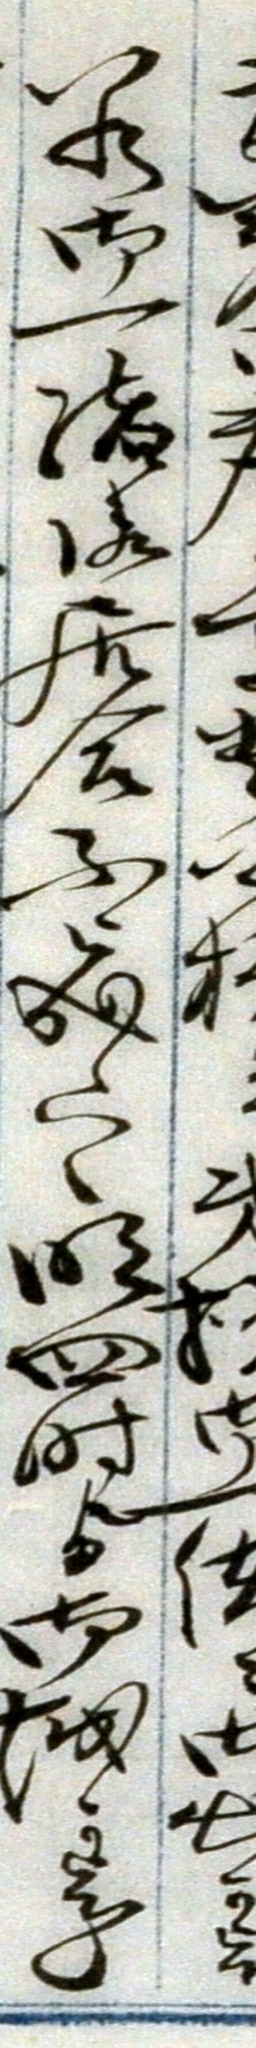若ご御一緒御居合不ヒ成候ハハ明四時ゟ御越可被下候
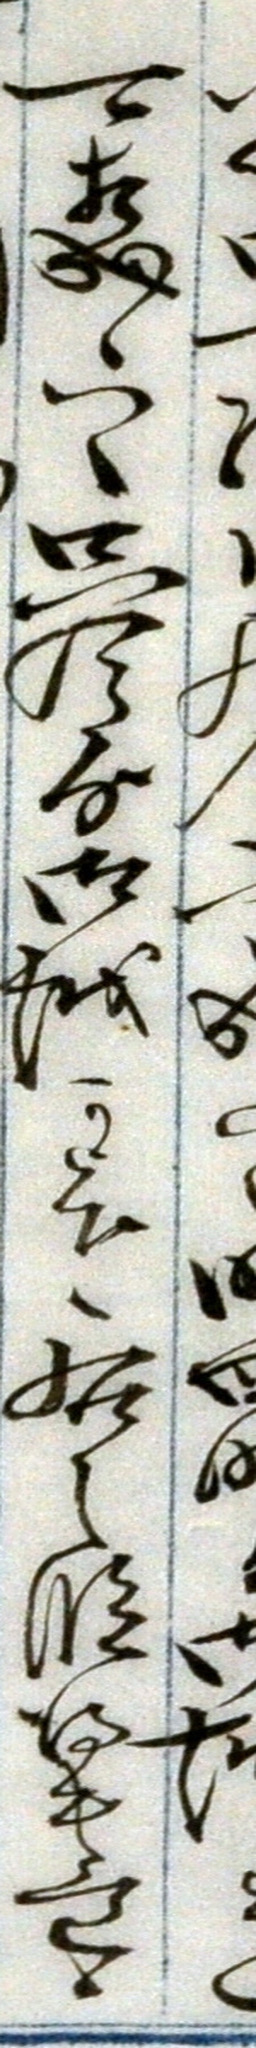可相成候ハヽ只今ゟ御越可被下候右之段得貴意候
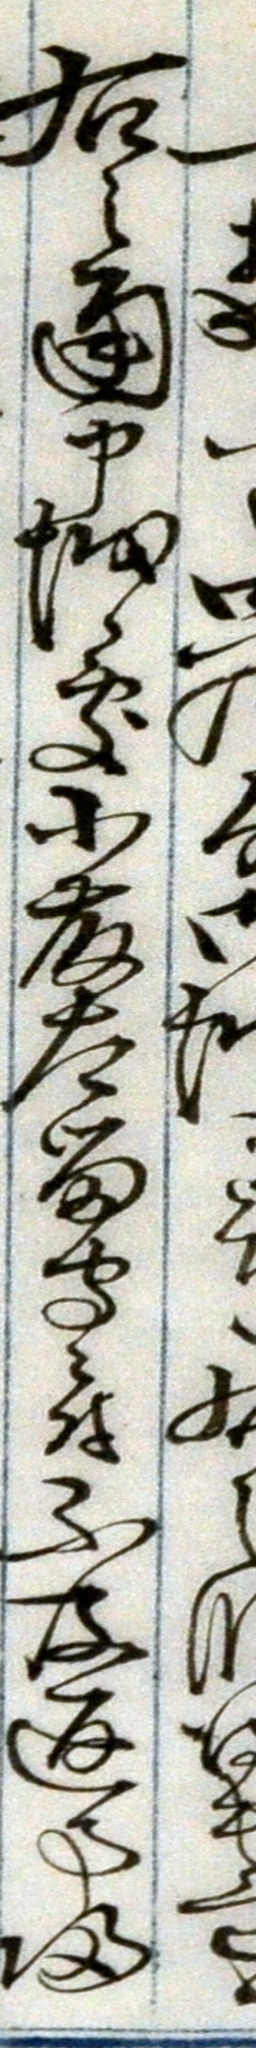右之通申越候處小藤太留守ニ付不及返事帰
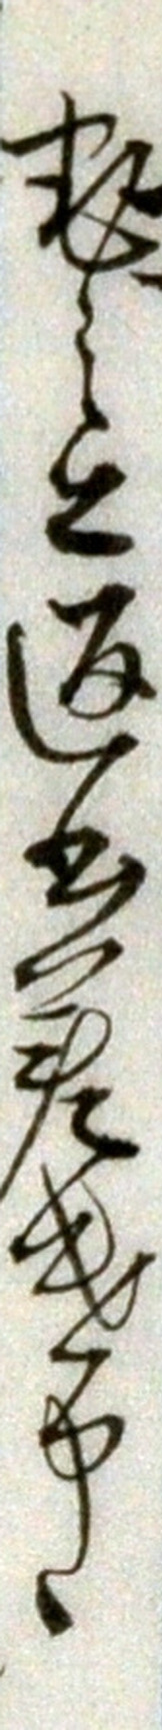宅之上返書差遣申候
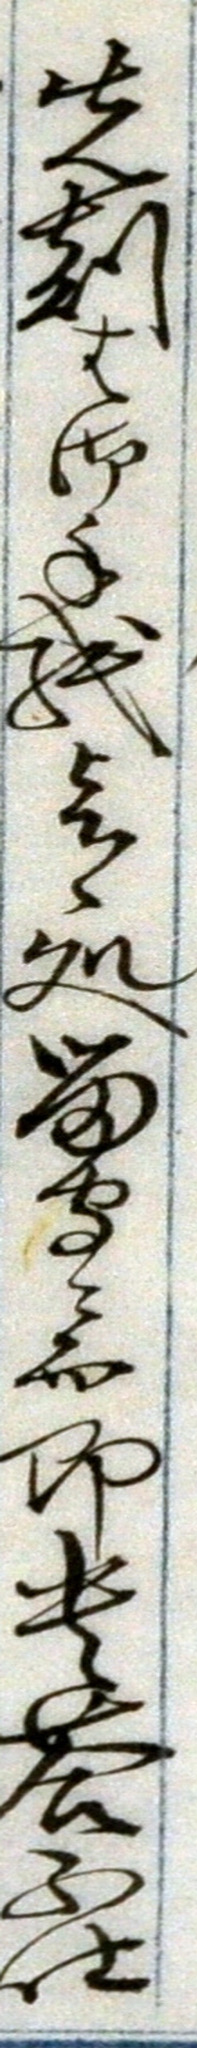先刻者御手紙被下候処留守ニ而即貴答不仕
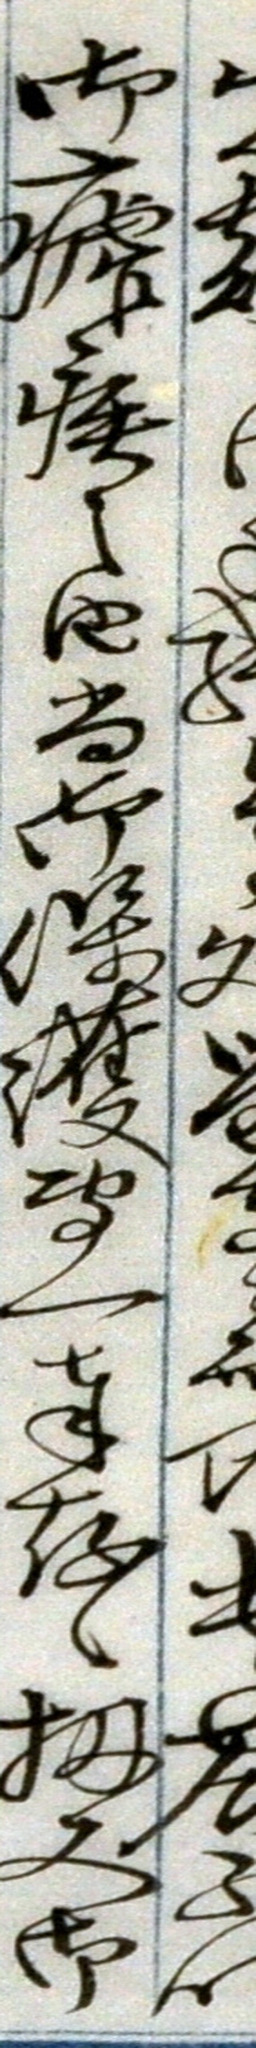御瘧疾之由尚御保護専一奉存候扨又御
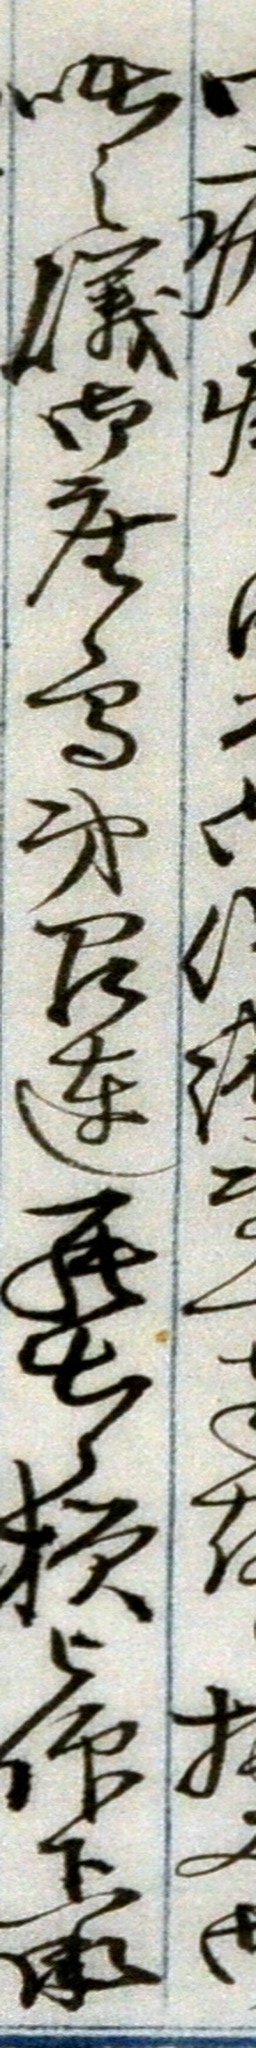咄之儀御座候間弟召連罷出候様被仰下承
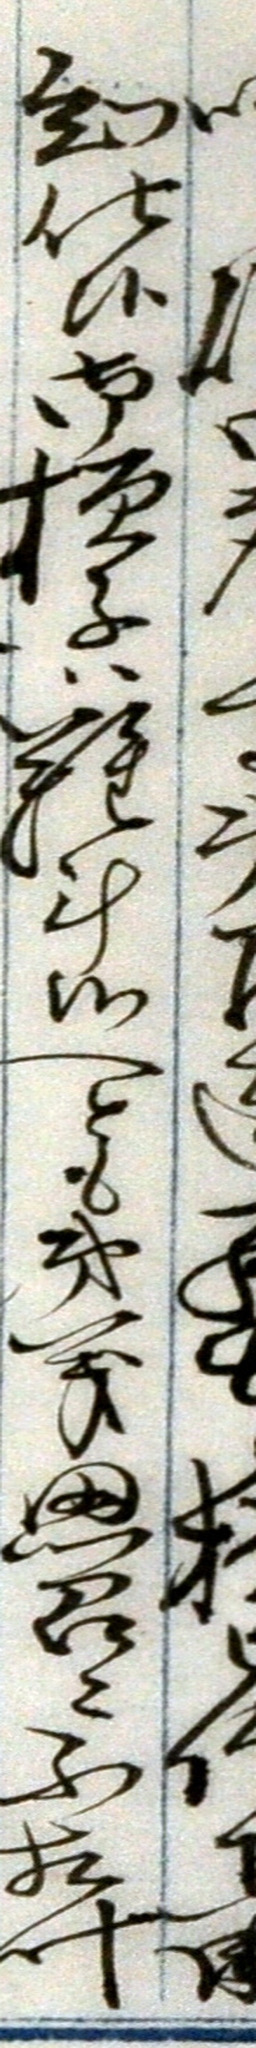知仕候御様子ハ難斗候へとも弟義思召ニ不相叶
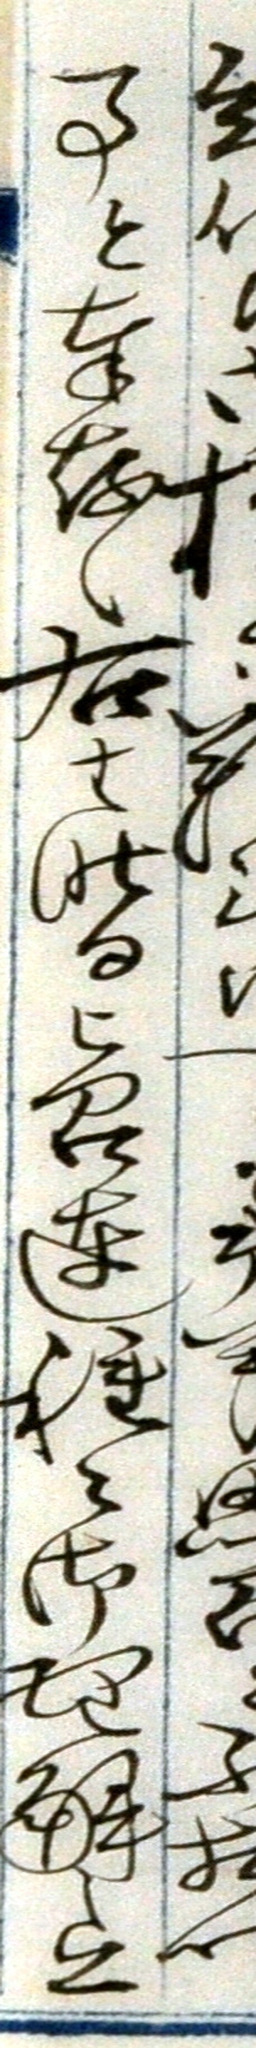事と奉存候右者昨日被召連種々御理解之上

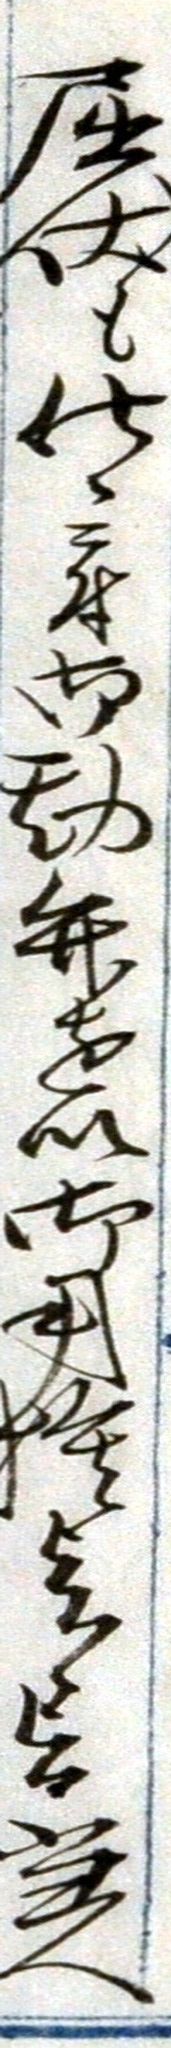屈伏も仕候ニ付御勘弁を以御用捨被下候旨当人
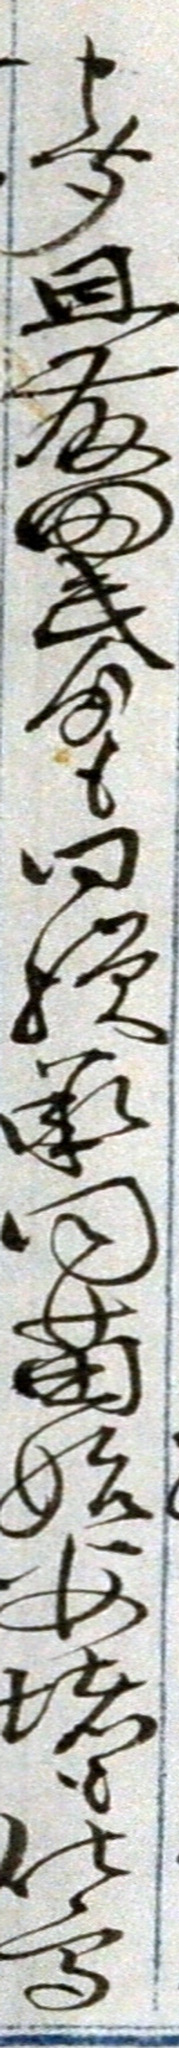申聞且藤田氏ゟも同様承同苗始安堵も仕候間
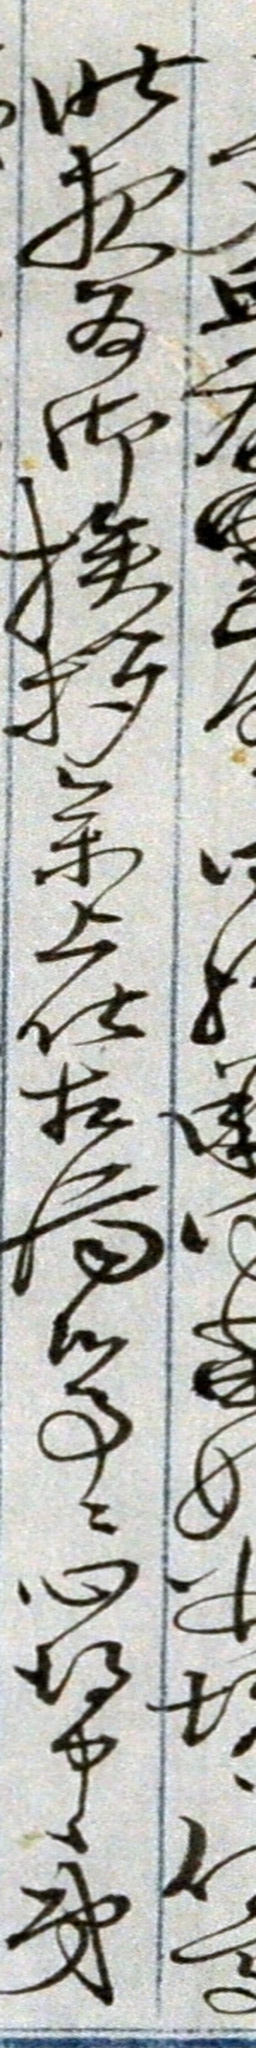昨夜為御挨拶参上仕相済候事ニ心得申候弟
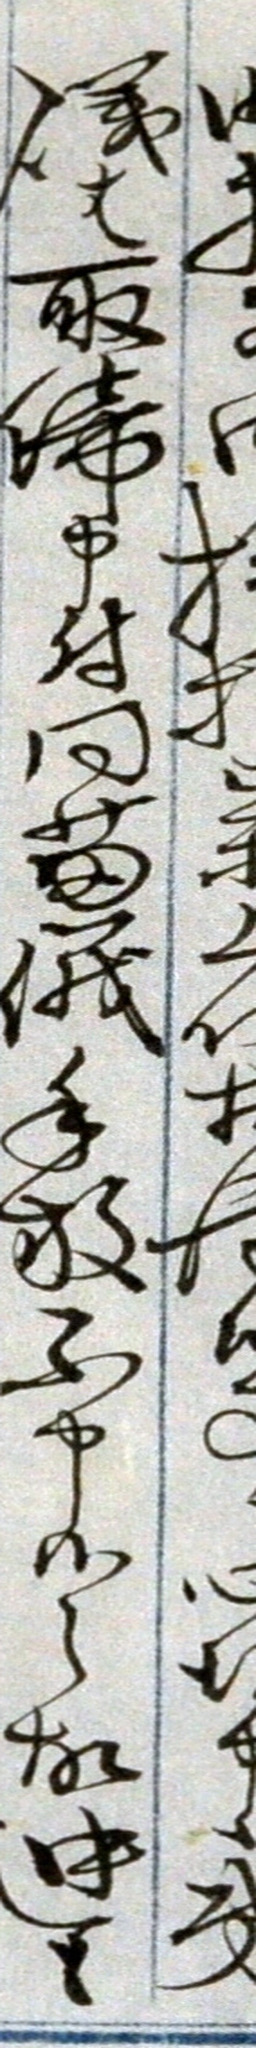儀者取締申付同苗儀手放不申候之故迚も
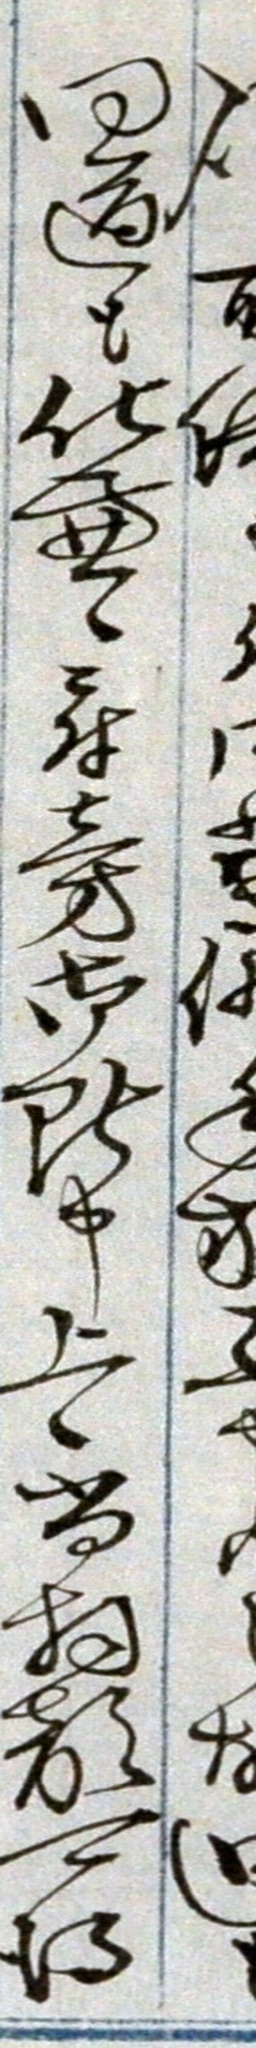同道も仕兼候ニ付旁御断申上候尚拝顔可得
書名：川面小藤太子細有之多賀谷唯右衛門ヲ打果候一件
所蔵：伊那市立高遠町図書館・合同会社AMANE
